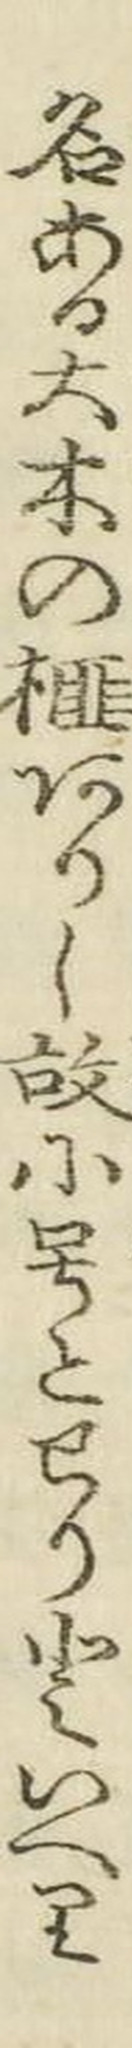名ある大木の榧ありし故に号とせりといへり
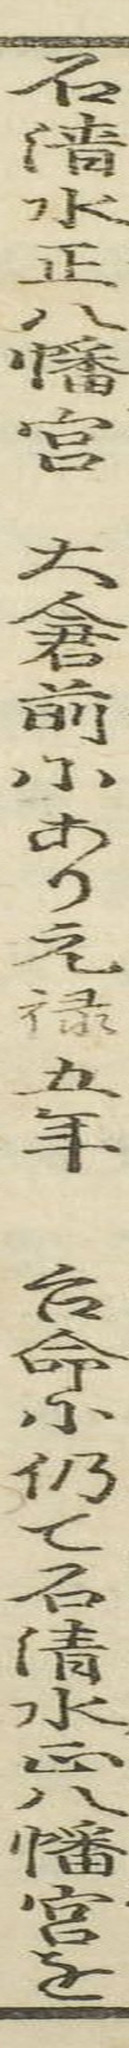石清水正八幡宮大倉前にあり元禄五年台命に仍て石清水正八幡宮を
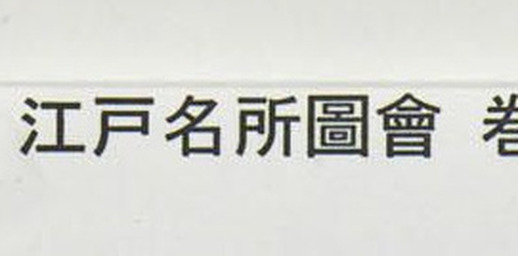江戸名所記に
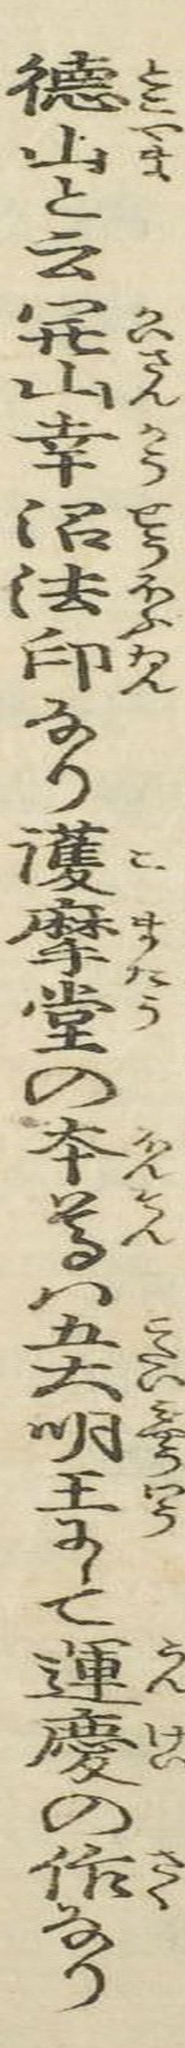徳山と云開山幸沼法印なり護摩堂の本尊は五大明王にして運慶の作なり
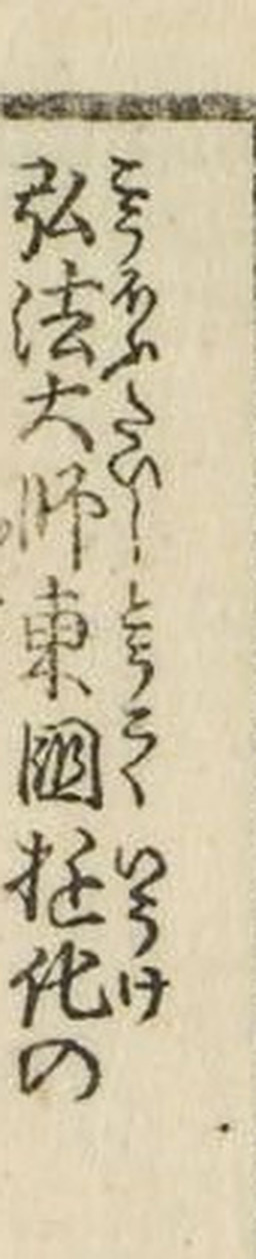弘法大師東国遊化の
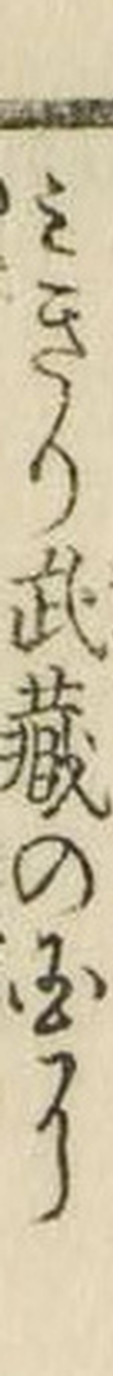みきり武蔵の国に
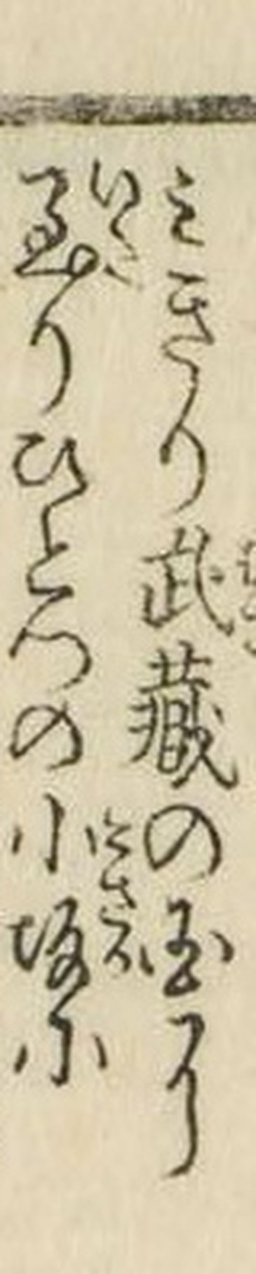至りひとつの小坂に
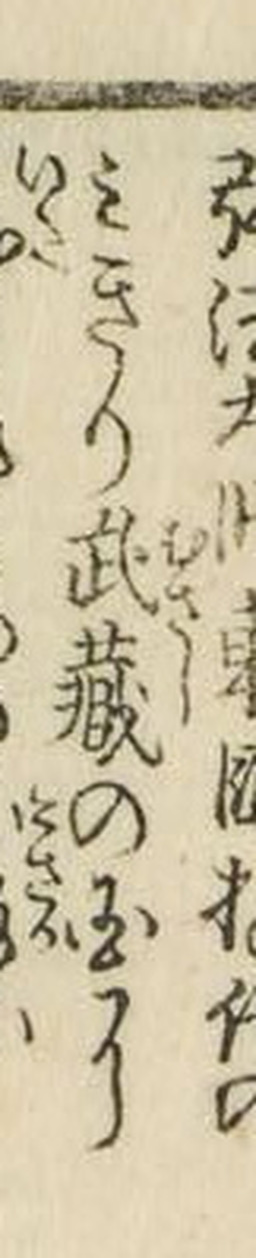みきり武蔵の国に
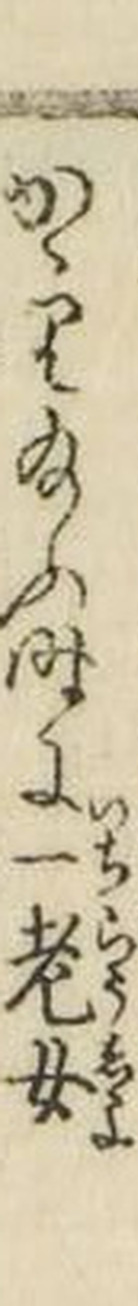かゝり給ふ時に一老女
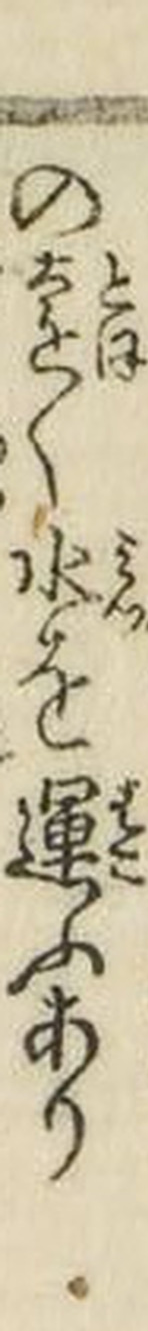の遠く水を運ふあり
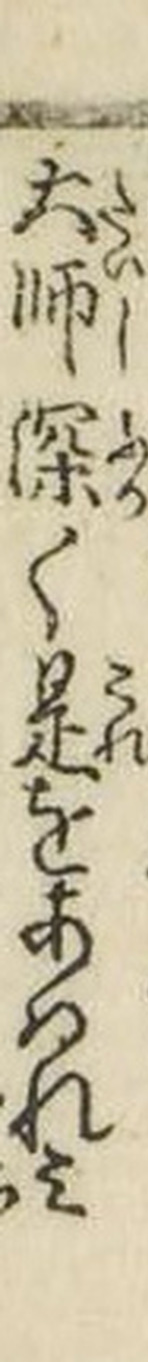大師深く是をあはれみ
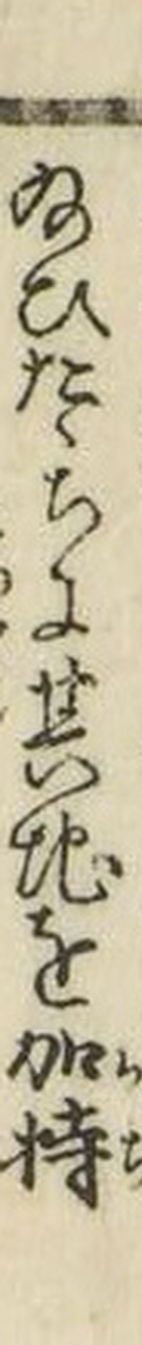給ひたゝちに其地を加持
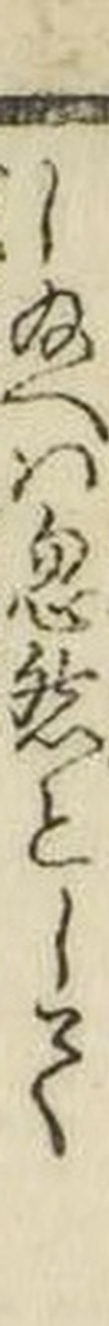し給へは忽然として
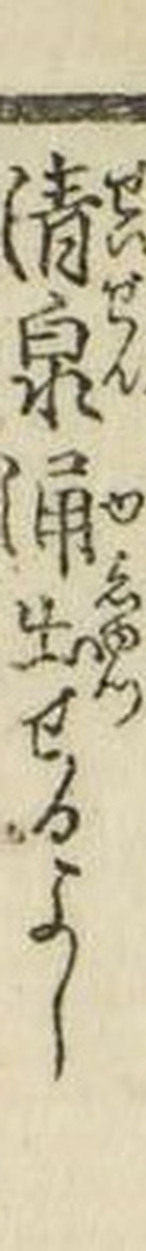清泉涌出せるよし
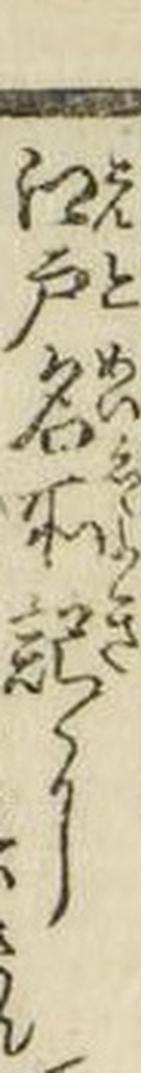江戸名所記に
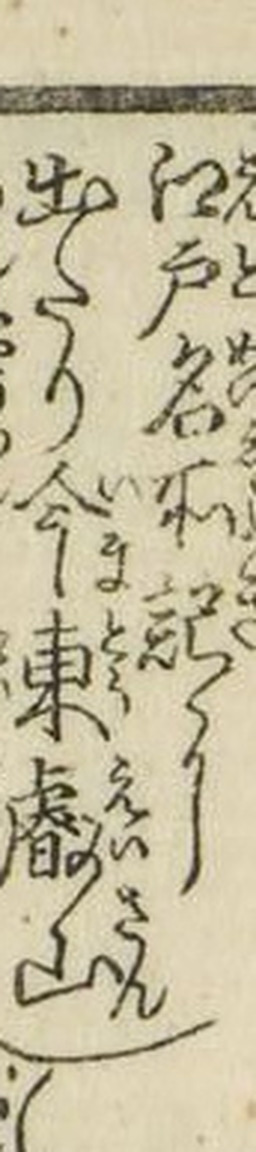出たり今東叡山
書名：江戸名所図会 20巻 巻之16
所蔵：東京学芸大学教育コンテンツアーカイブ
